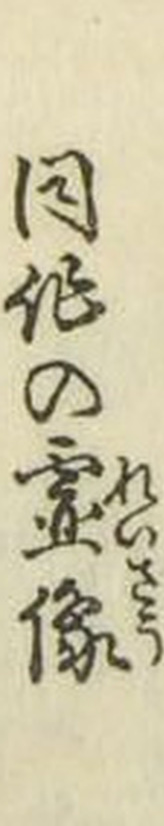同作の霊像
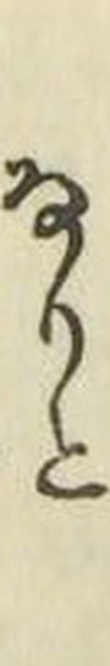なりと
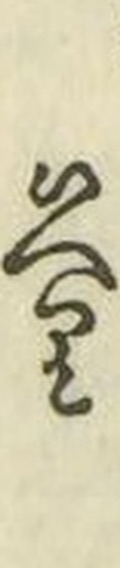いへり
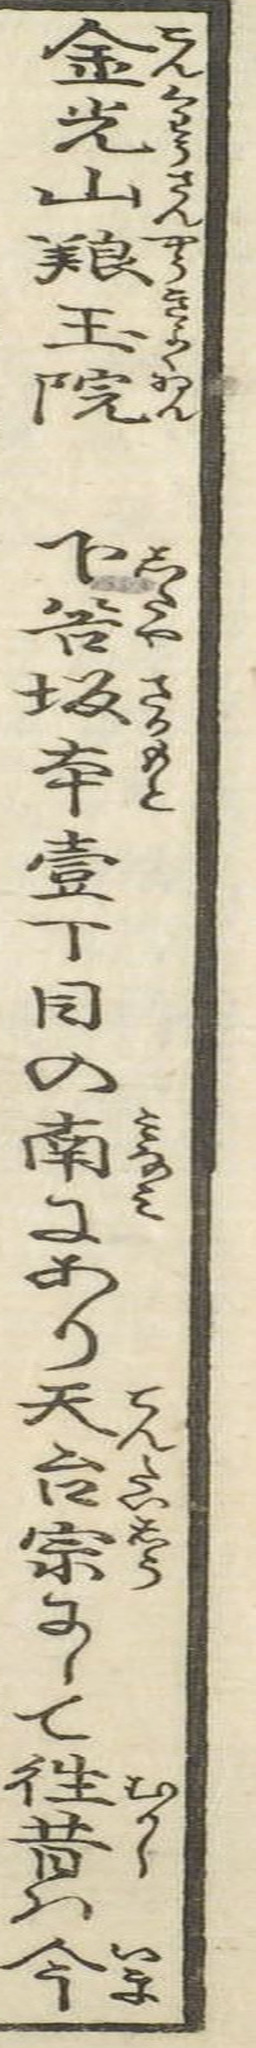金光山養玉院下谷坂本壱丁目の南にあり天台宗にして往昔は今
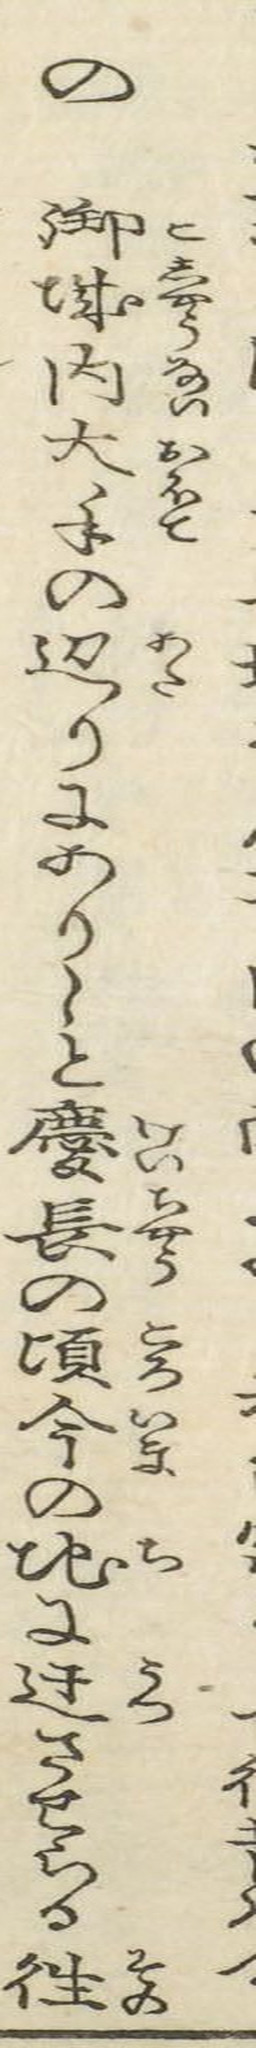の御城内大手の辺りにありしと慶長の頃今の地に遷させらる往
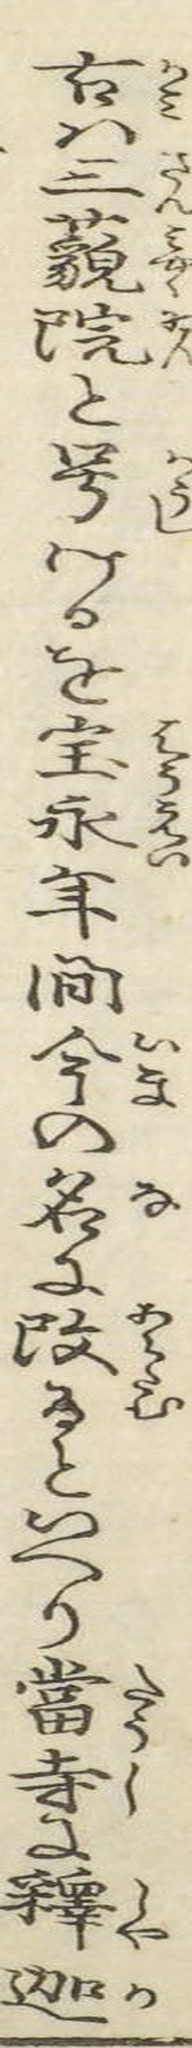古は三藐院と号けるを宝永年間今の名に改るといへり当寺に釈迦
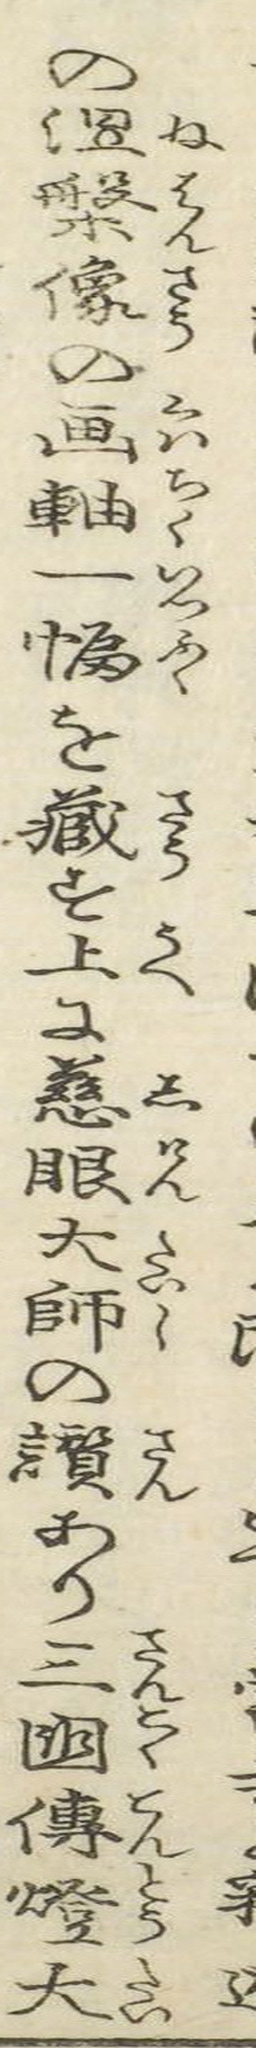の涅槃像の画軸一幅を蔵す上に慈眼大師の讃あり三国伝燈大
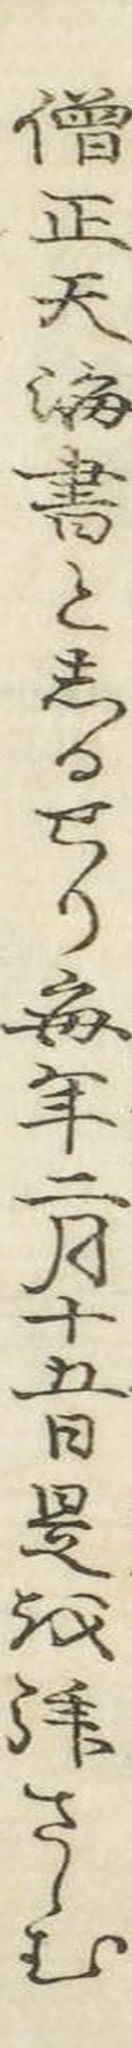僧正天海書としるせり毎年二月十五日是を拝さしむ
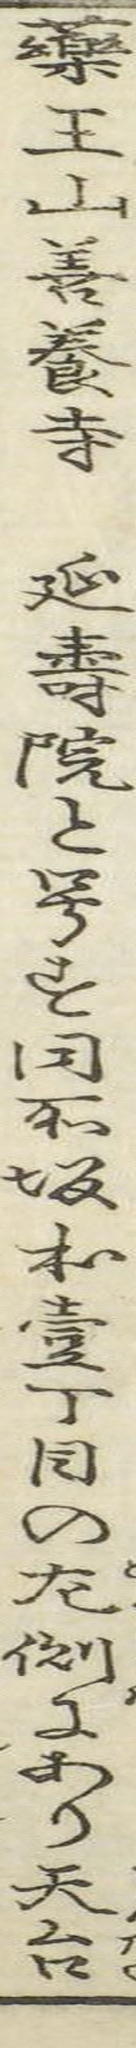薬王山善養寺延寿院と号す同所坂本壱丁目の左側にあり天台
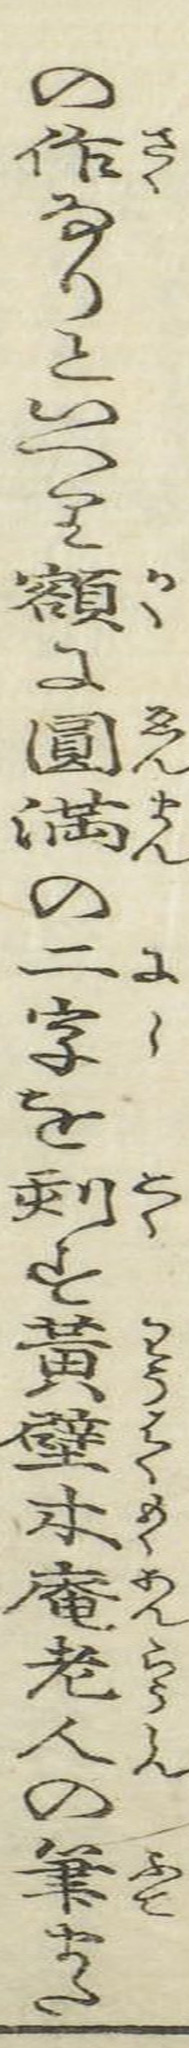の作なりといへり額に円満の二字を刻す黄壁木庵老人の筆また
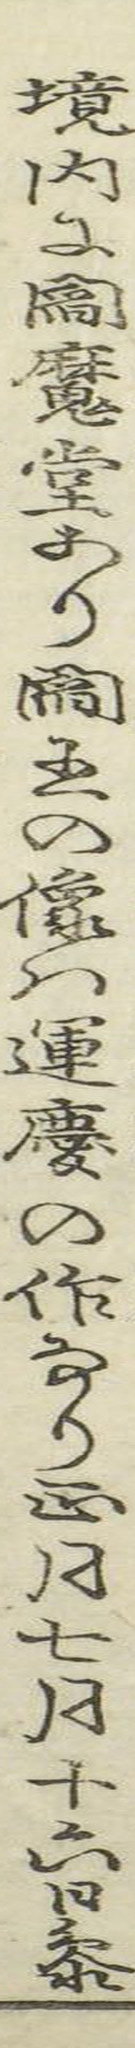境内に閻魔堂あり閻王の像は運慶の作なり正月七月十六日参
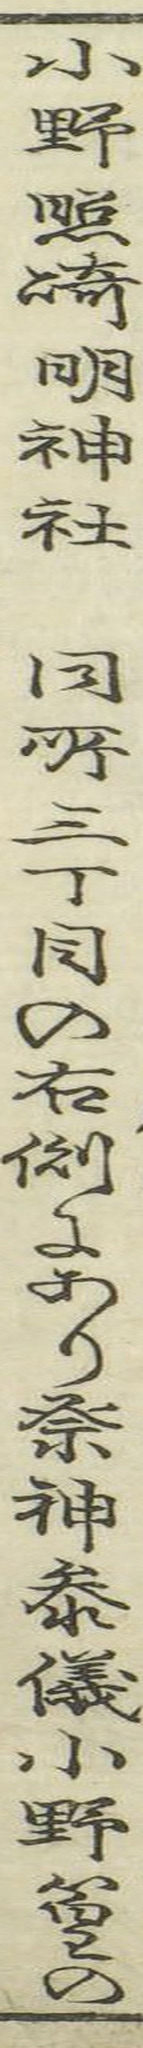小野照崎明神社同所三丁目の右側にあり祭神参儀小野篁の
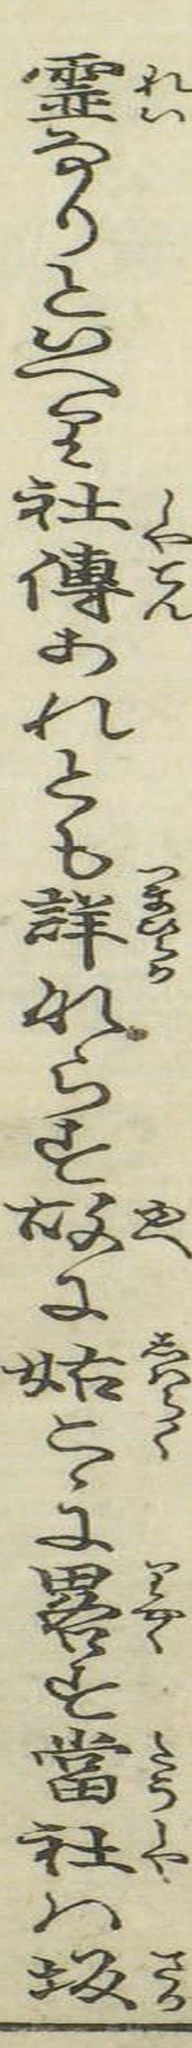霊なりといへり社伝あれとも詳ならす故に姑こゝに略す当社は坂

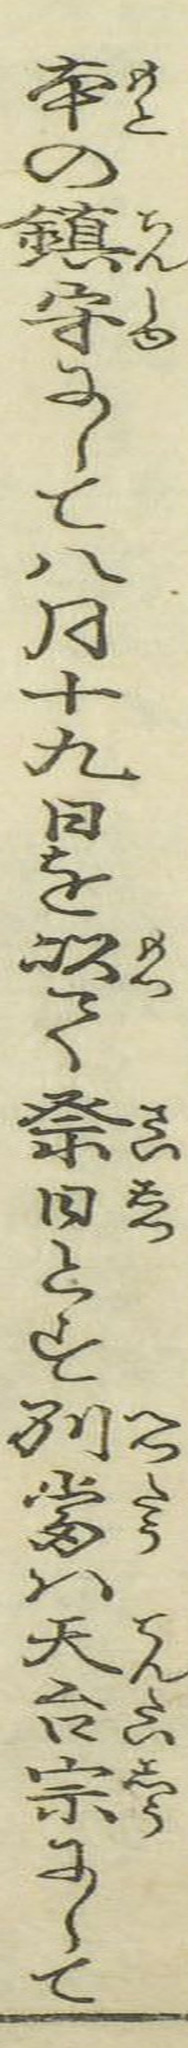本の鎮守にして八月十九日を以て祭日とす別当は天台宗にして
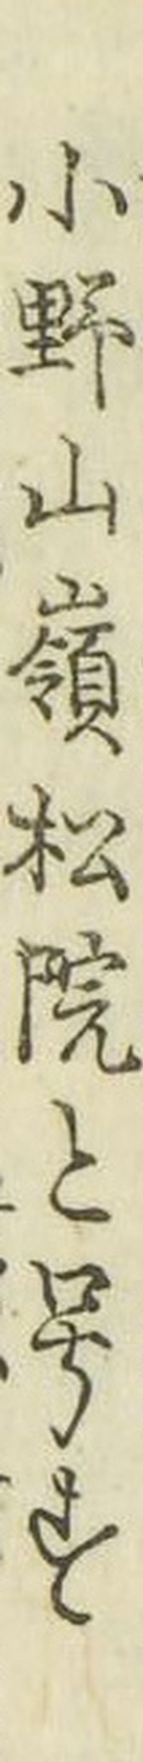小野山嶺松院と号す
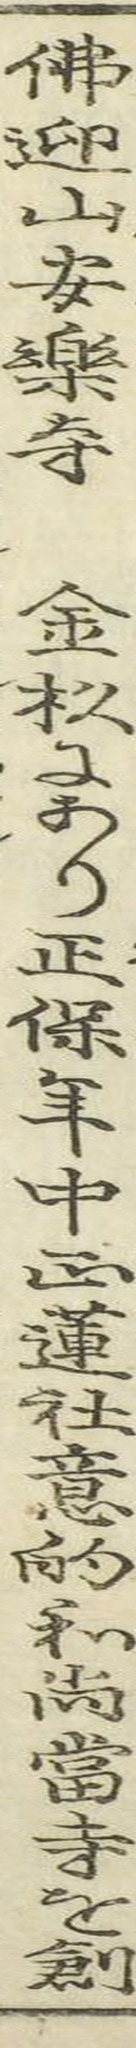仏迎山安楽寺金杉にあり正保年中正蓮社意的和尚当寺を創
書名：江戸名所図会 20巻 巻之17
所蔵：東京学芸大学教育コンテンツアーカイブ
